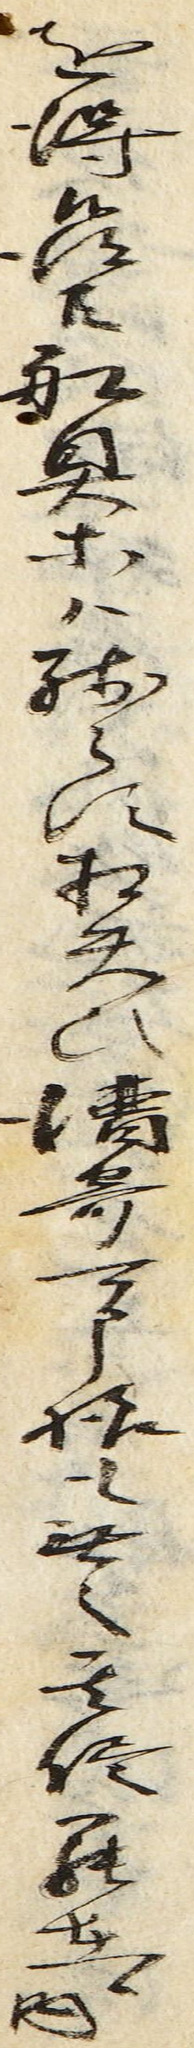を得候得共船具等ハ残らす相失ひ漕寄可申様も無之其儘罷在候内

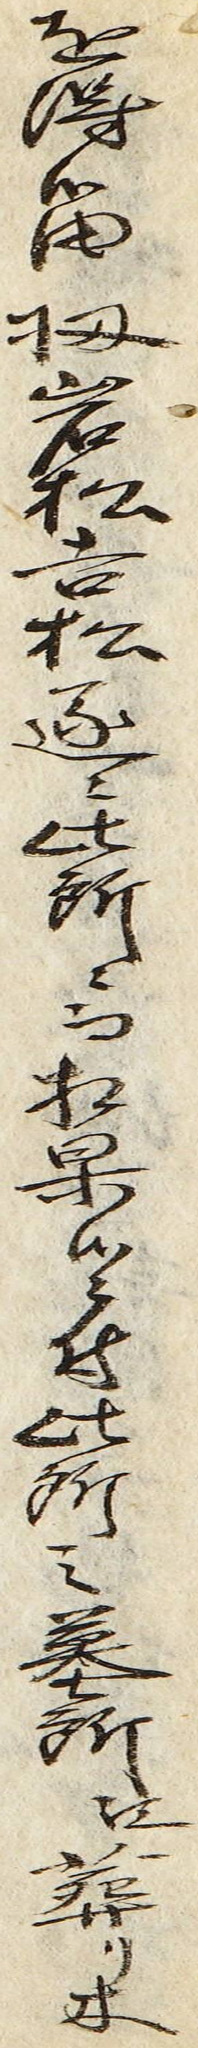を得候由扨岩松吉松遂ニ此所ニ而相果候ニ付此所之墓所江葬り木
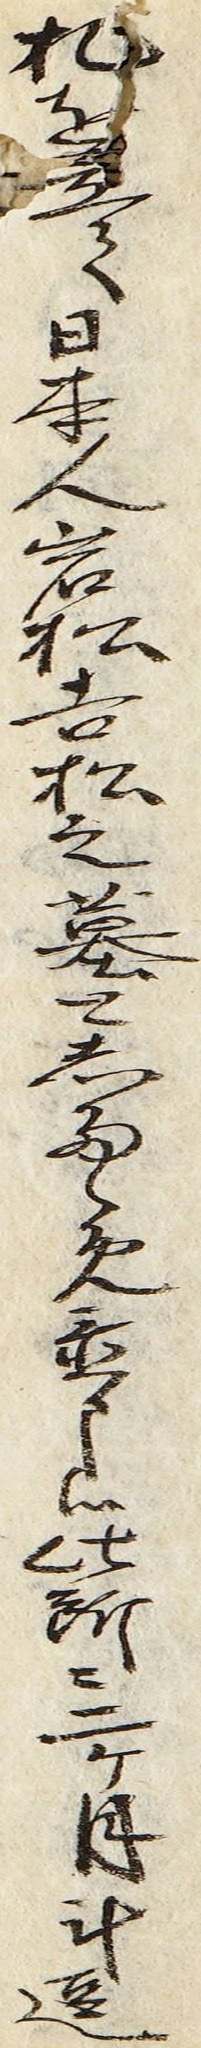札を立て日本人岩松吉松之墓としるしめ置申候此所ニ二ケ月計逗
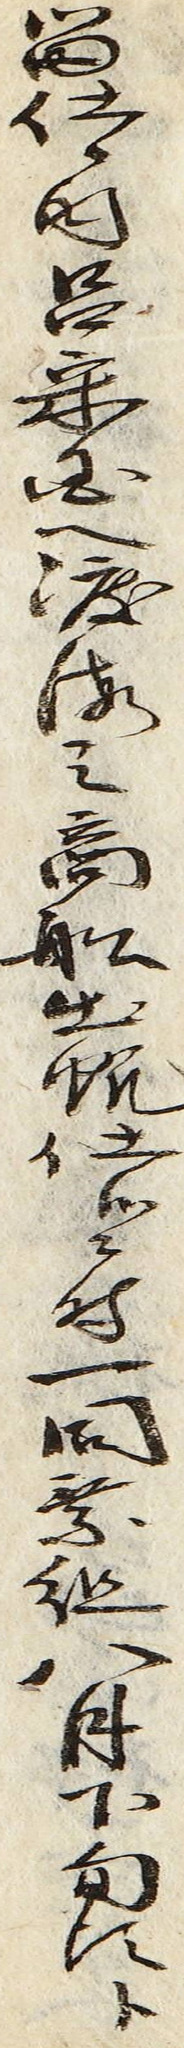留仕候内呂宋国へ渡海之商船出帆仕候ニ付一同乗組八月下旬頃ト
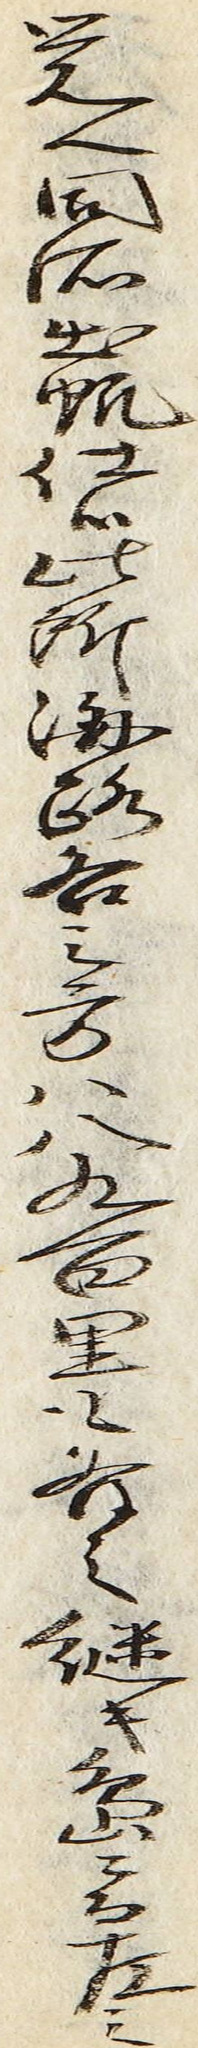覚へ同所出帆仕候此所海路右之方ハ八九百里も有之継キ島ニ而左之
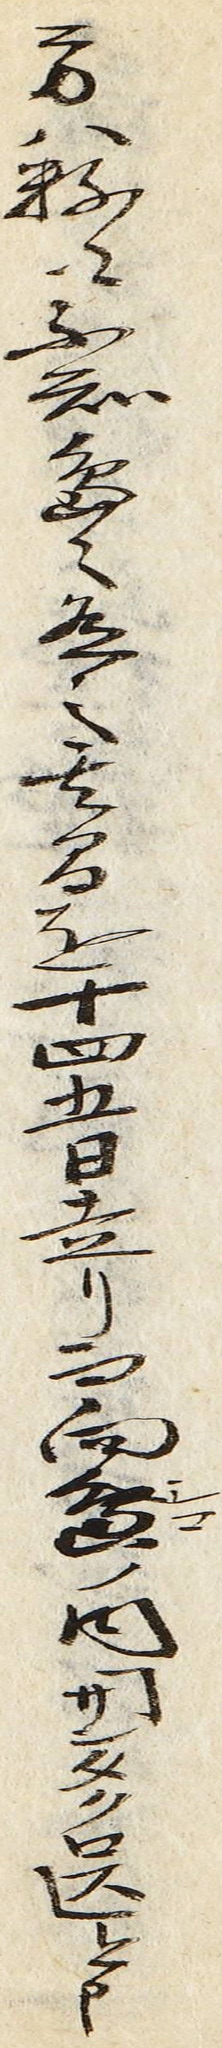方ハ数も不知島々有之其間を十四五日走り而向島ノ内「サンタクロス」と申
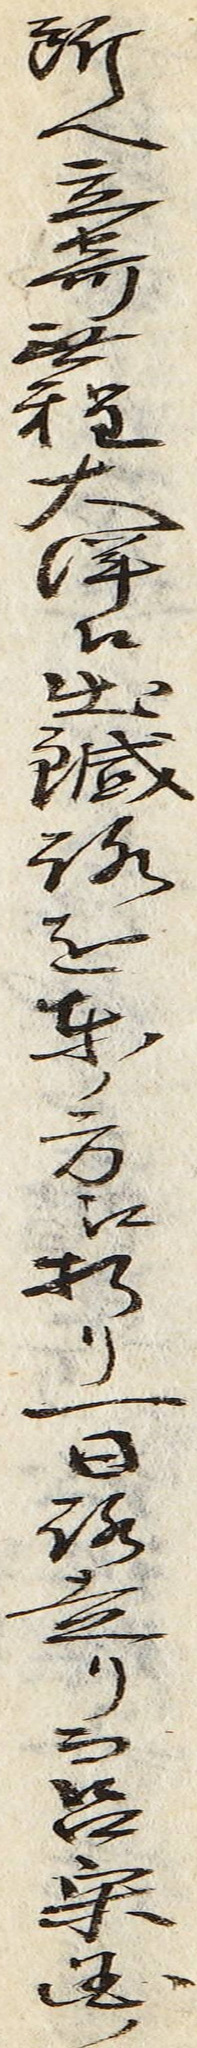所へ立寄無程大洋江出緘路を東ノ方江折り一日路走り而呂宋国ノ
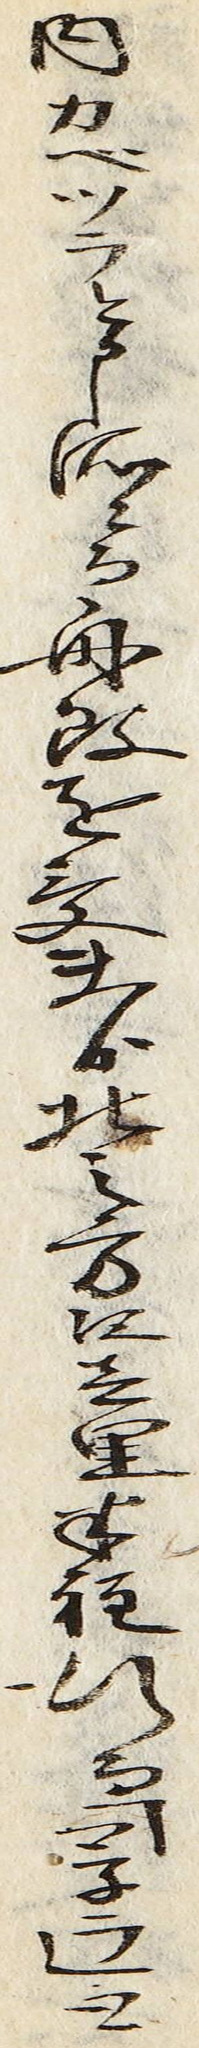内カベツラと申所ニ而舟改を受夫ゟ北之方江壱里半程行而「マネラ」と
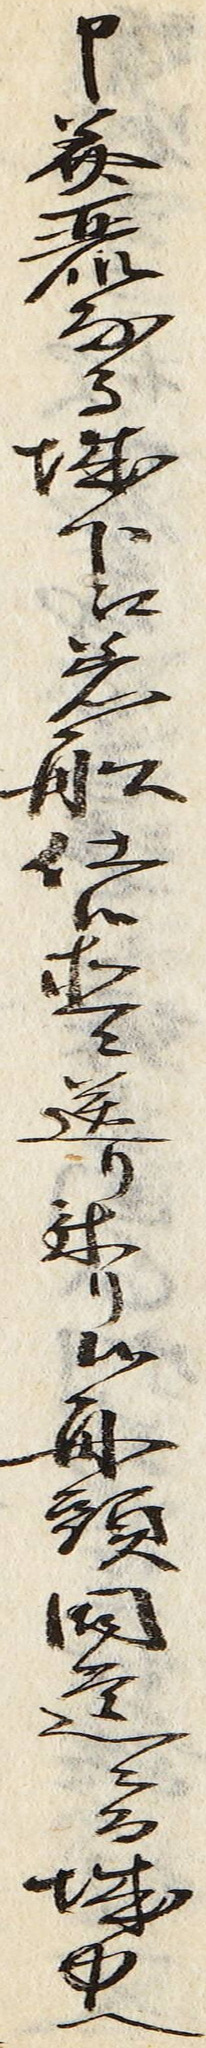申華麗なる城下江着船仕候直ニ送り来り候船頭同道ニ而城中へ
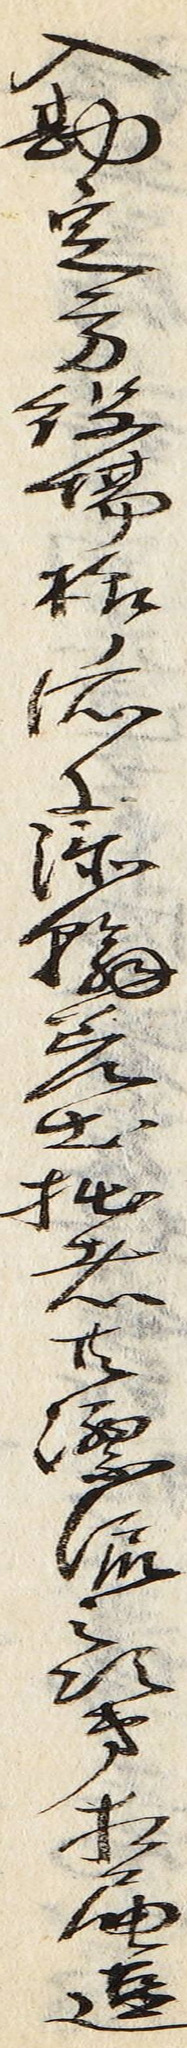入勘定方役場様ノ所に添翰差出拙者共漂流之次第相届逗
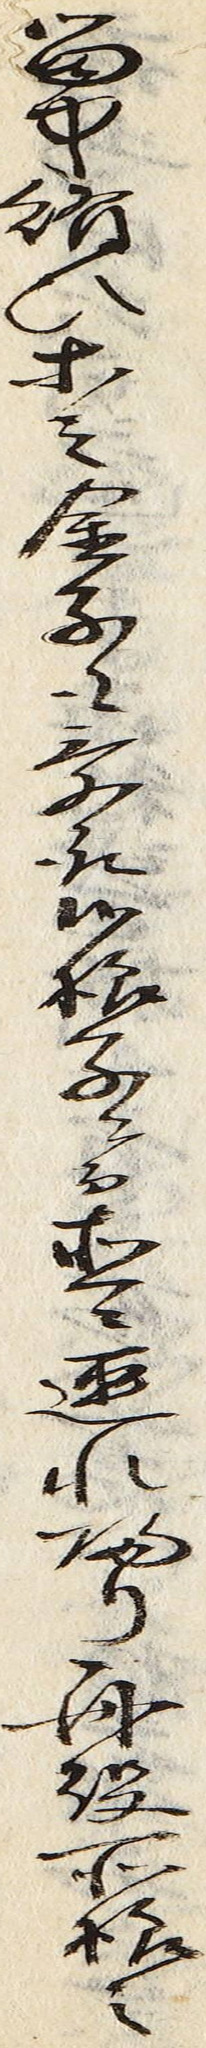留中賄ひ等之金子も受取候様子ニ而直ニ連れ帰り舟役所様之
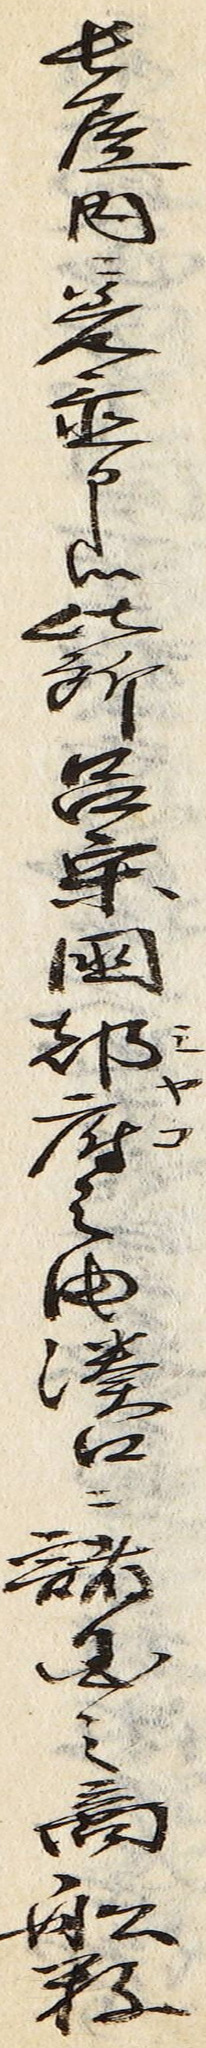長屋内ニ差置申候此所呂宋国都府之由湊口ニ諸国之商船数
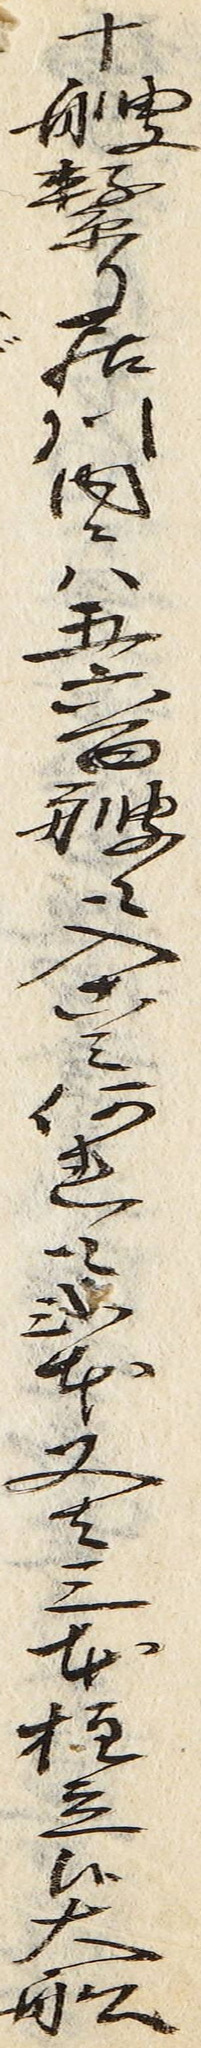十艘繋り居川内ニハ五六百艘も入こ之何も弐本又は三本柱立候大船
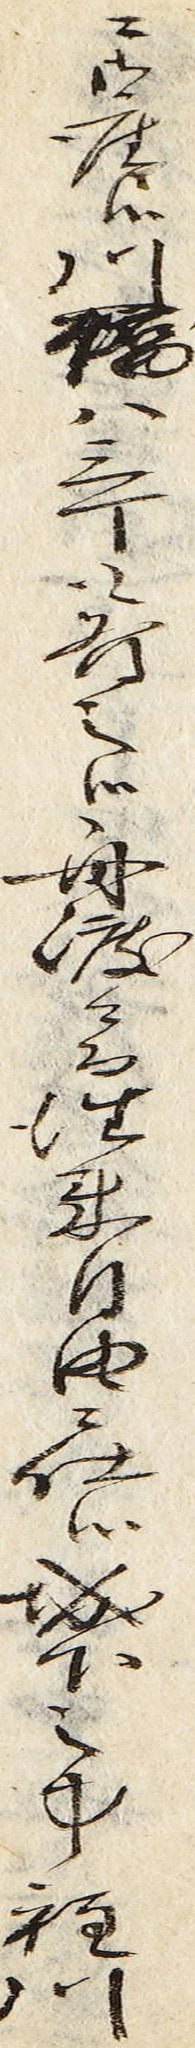ニ御座候川幅ハ三丁も有之候舟渡ニ而往来自由ニ仕候城下之中程川
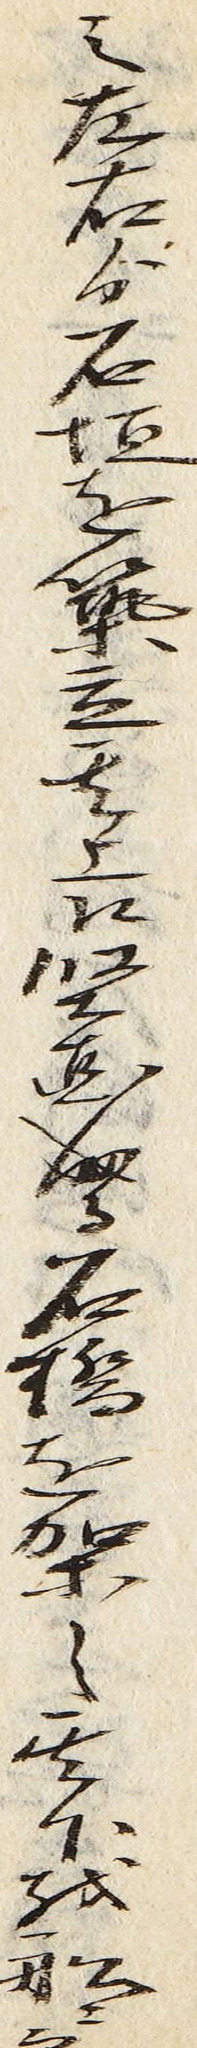之左右ゟ石垣を築立其上江堅固成る石橋を架し其下を船ニ而
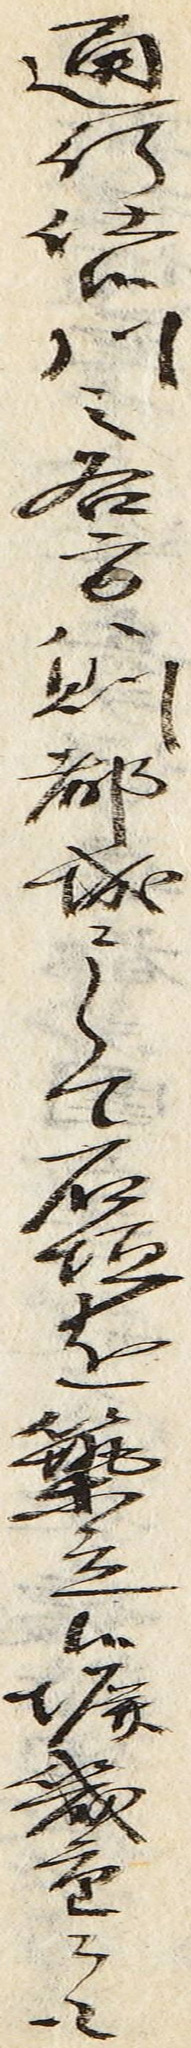通行仕候川之右方ハ則都城ニして石垣を築立候塀幾重ニも
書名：漂流呂宋国記
